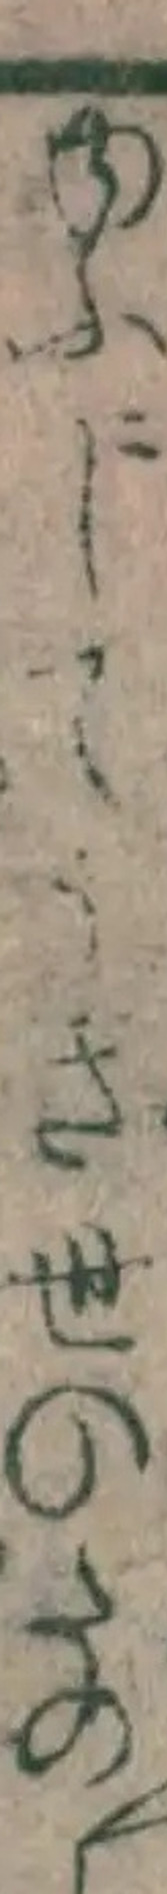ゆふにしてうき世のたの
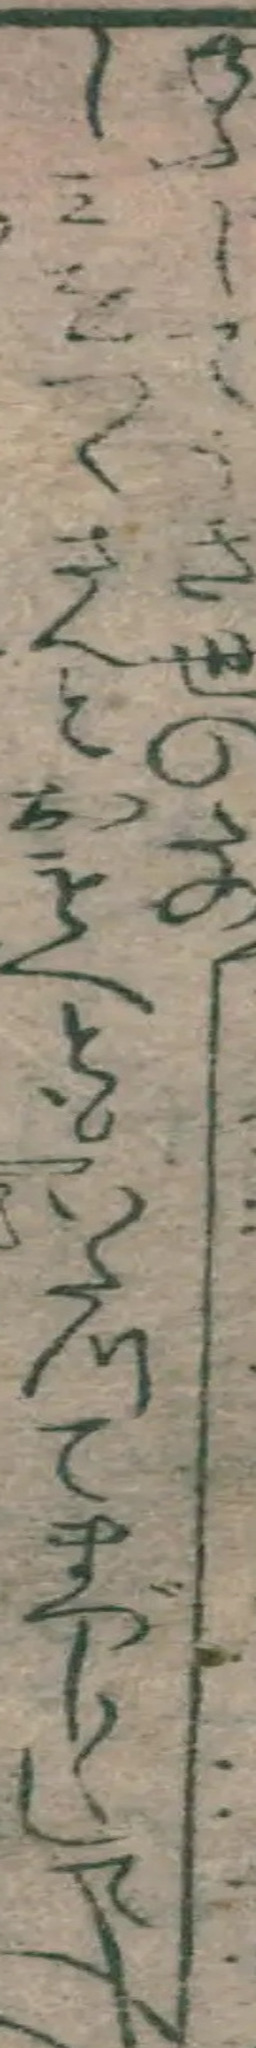しみをつくさんとおもへともいたつてまづしくして
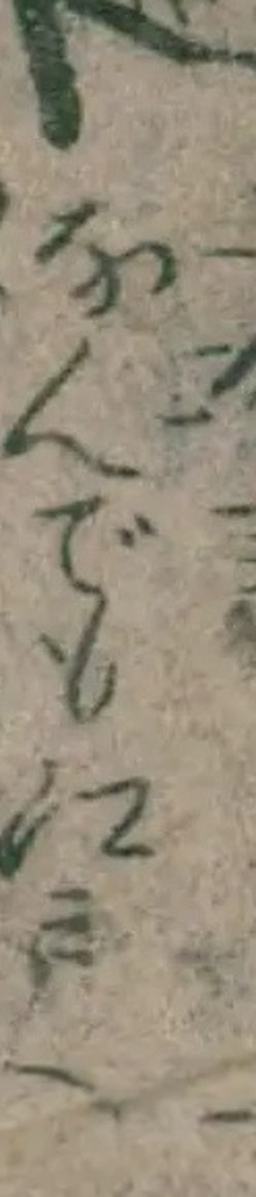なんでも江戸へ
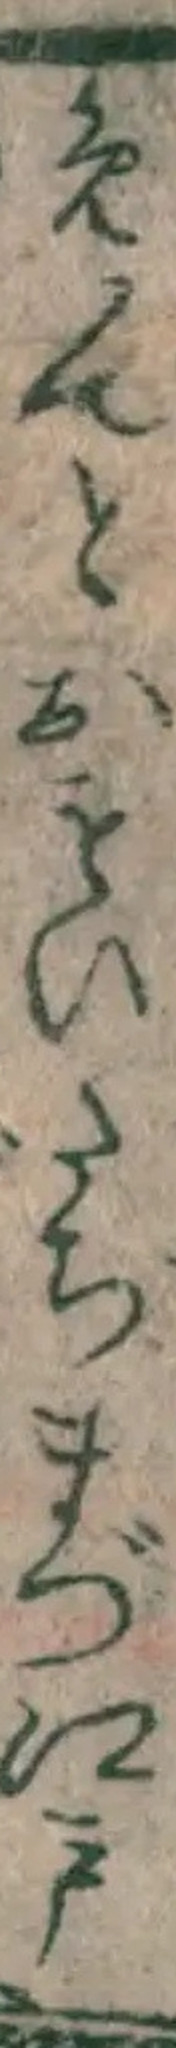めんとおもひたちまづ江戸
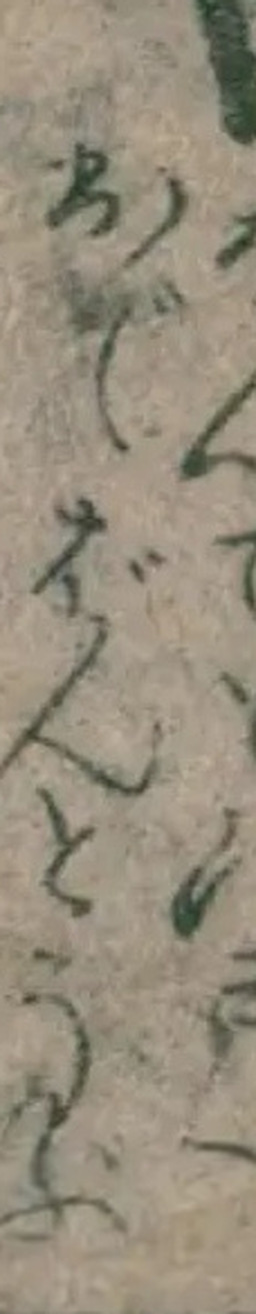出でばんとうかぶ
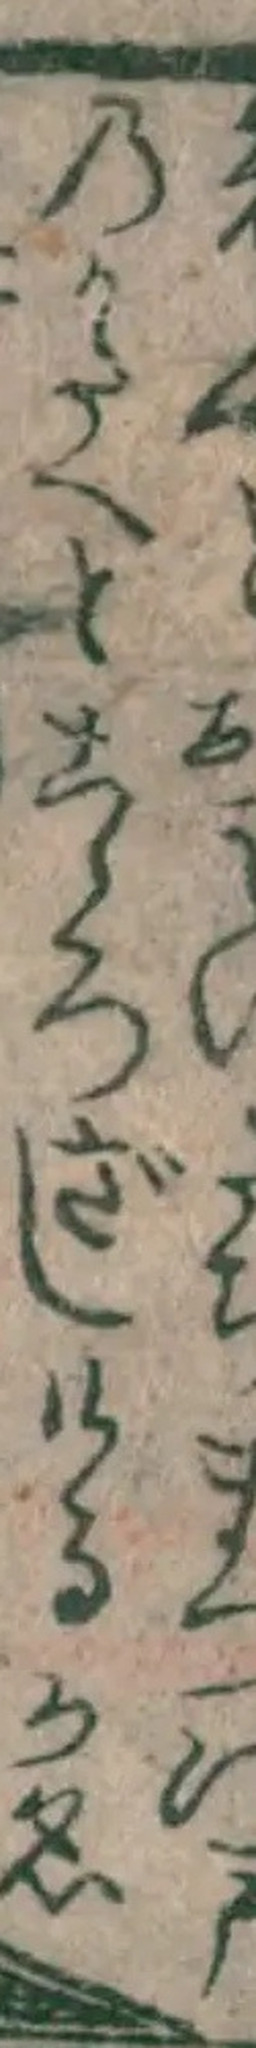のかたへとこゝろざしけるか名
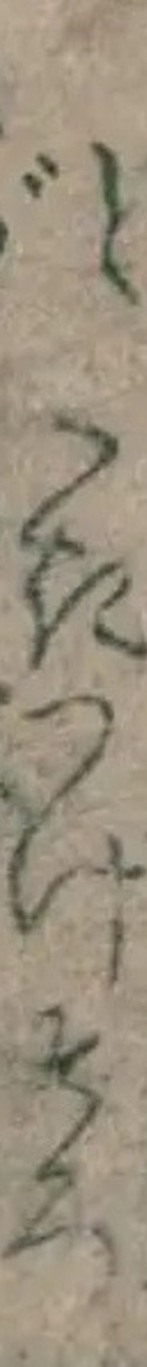とこきつけそろ
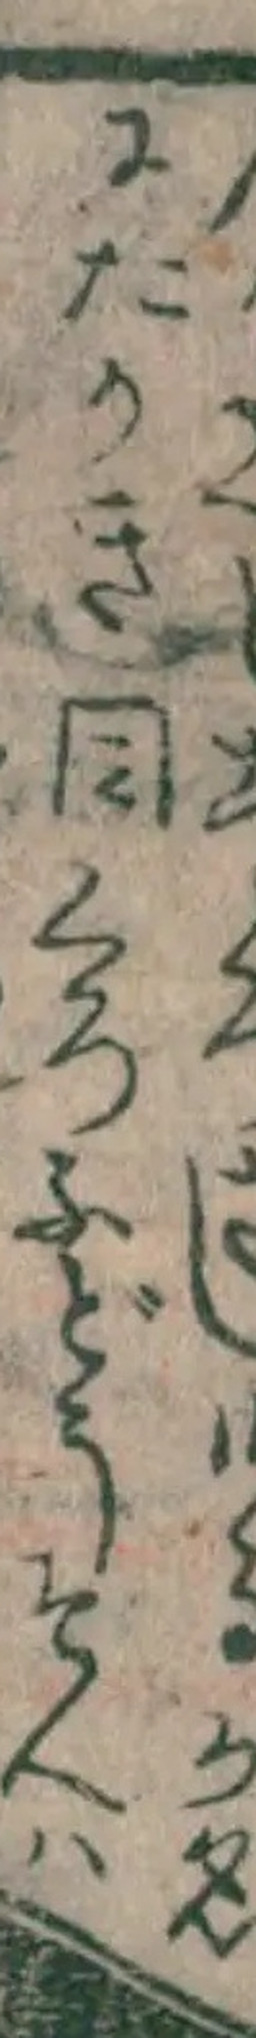にたかき目くろふどうそんは
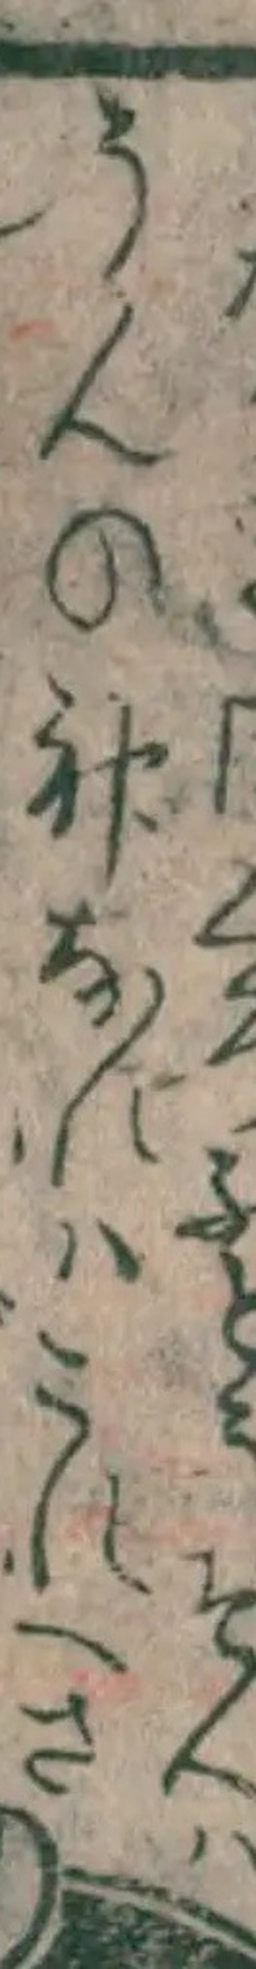うんの神なれはこれへさ
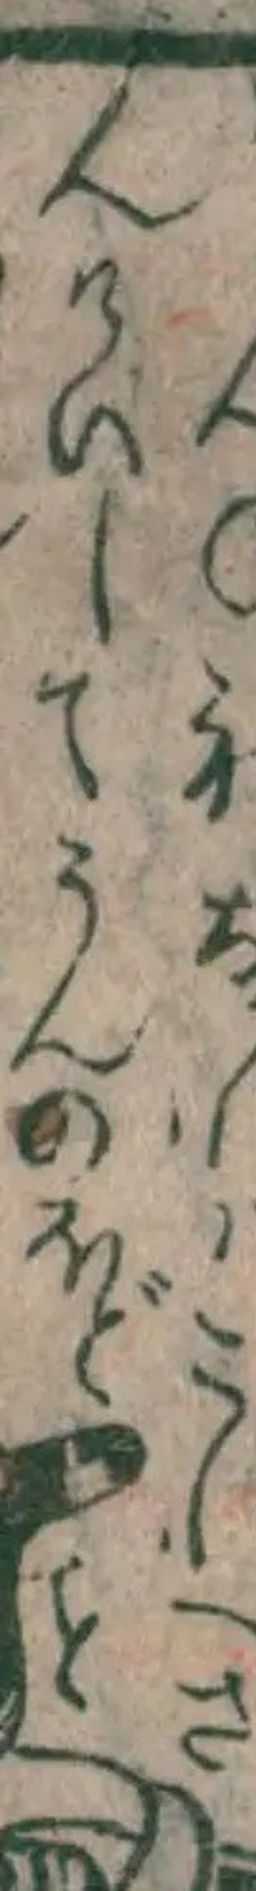んけいしてうんのほどを
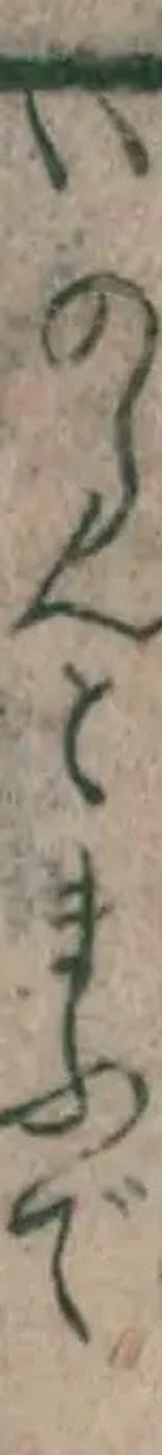いのらんとまふで
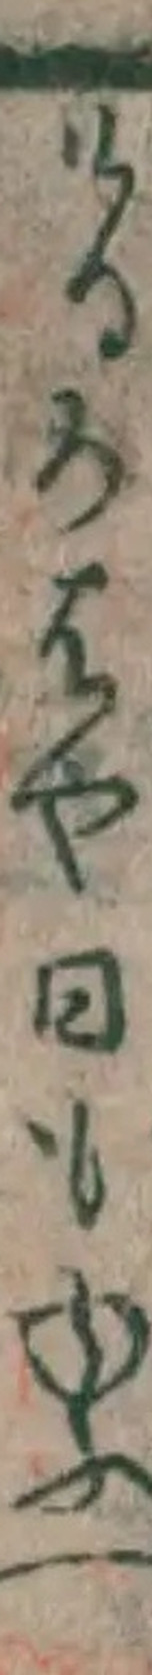けるかはや日もゆふ
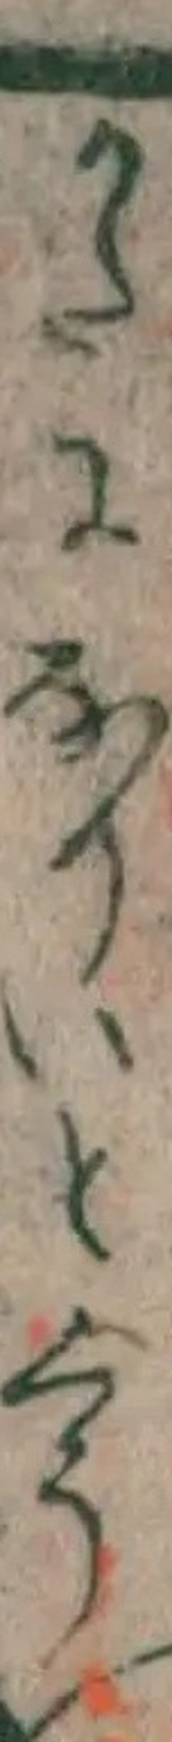かたになりいとくう
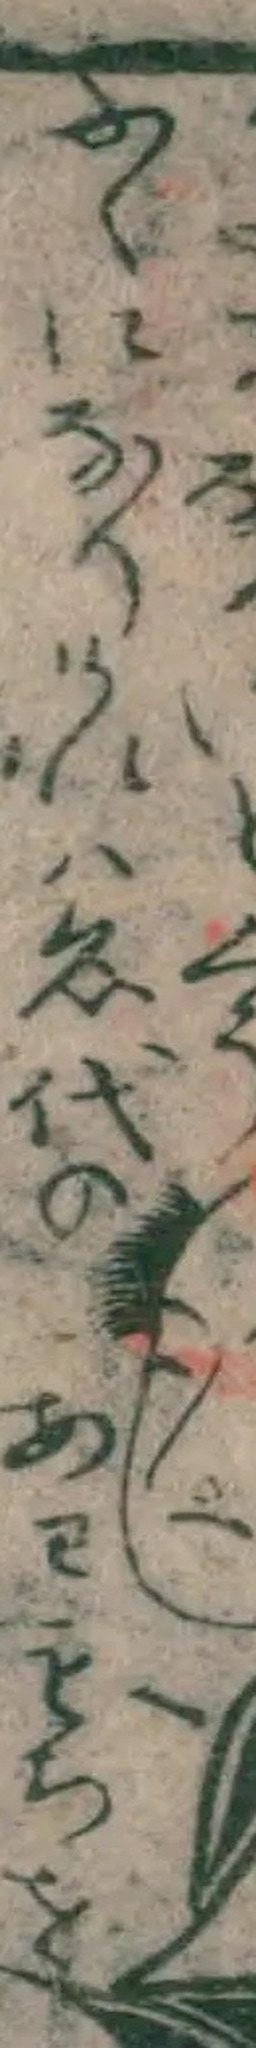ふくになりけれは名代のあわもちを
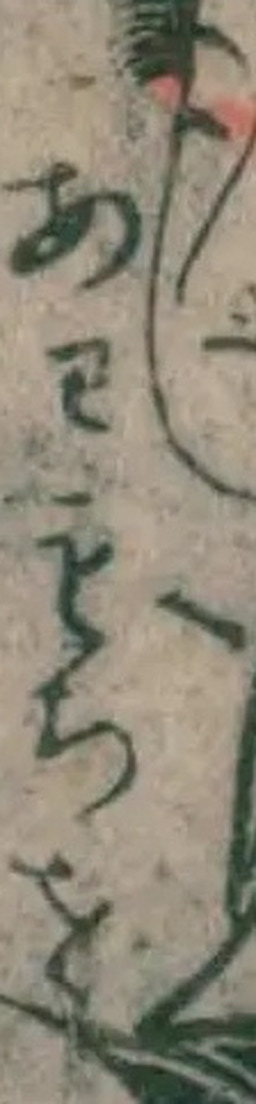本あわもち
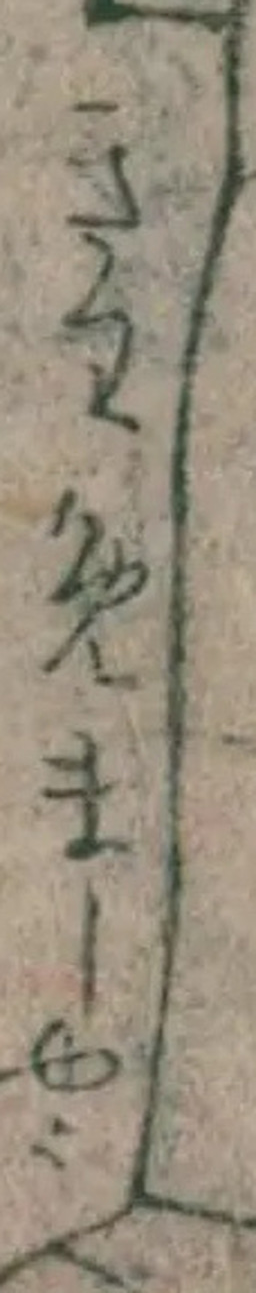きわめましやう
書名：金々先生栄花夢 : 2巻
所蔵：国立国会図書館 National Diet Library, JAPAN
